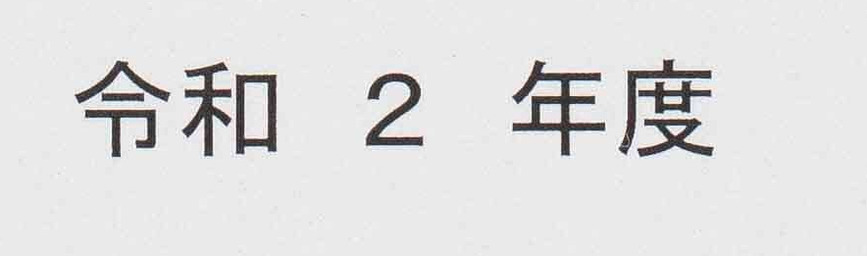令和２年度
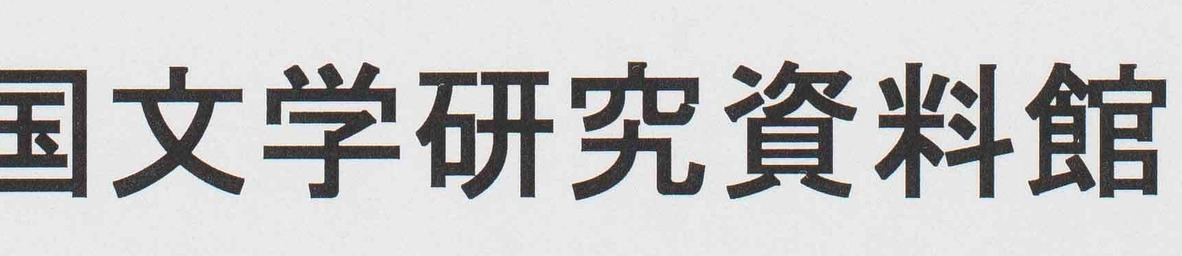国文学研究資料館
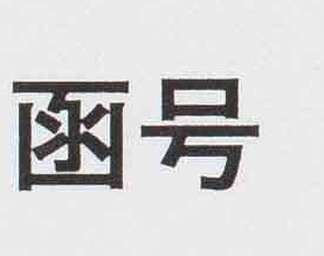函号/

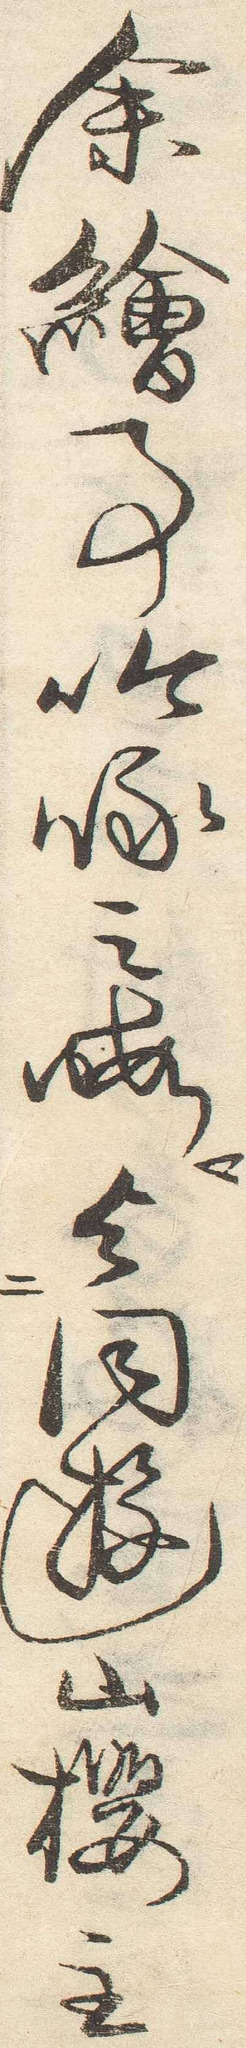余絵事吟詠之暇与同遊山桜主
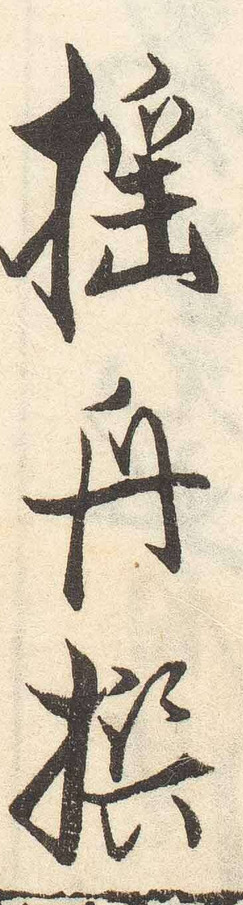揺舟撰
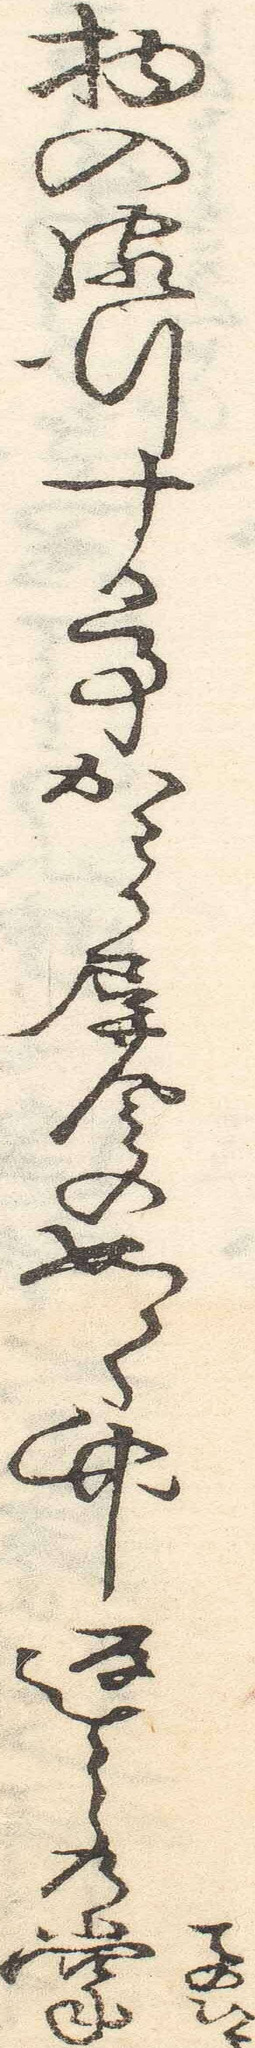物の流行する事かわり屏風の如く竹返しの掌
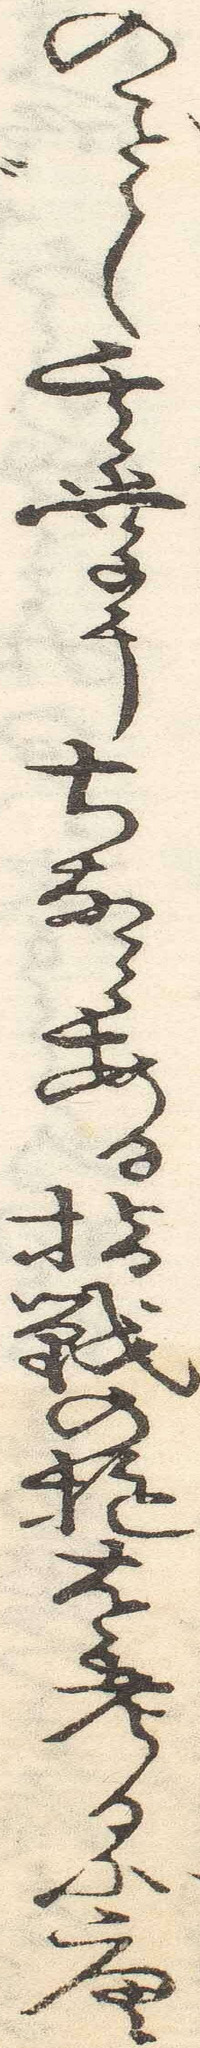のごとし、其掌にちなみある指戦の遊を考るに、唐
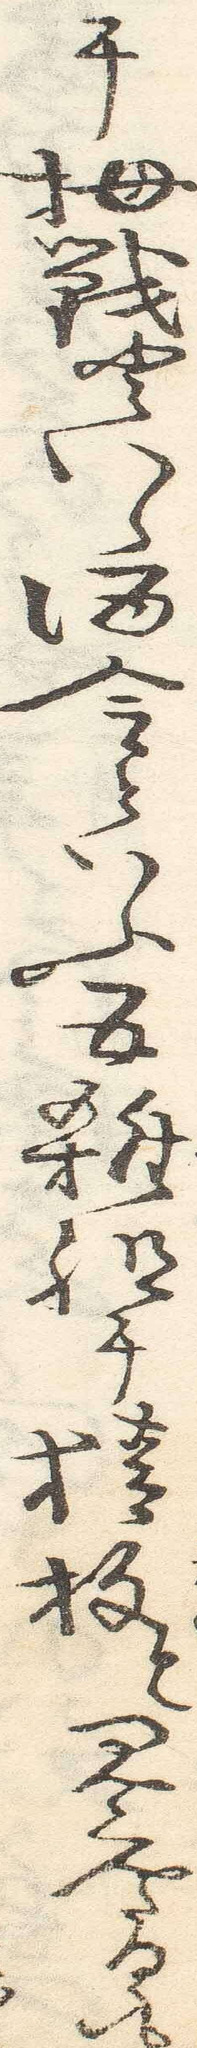に拇戦といゝ酒令といふ、五雑組に精枚と見えたるも
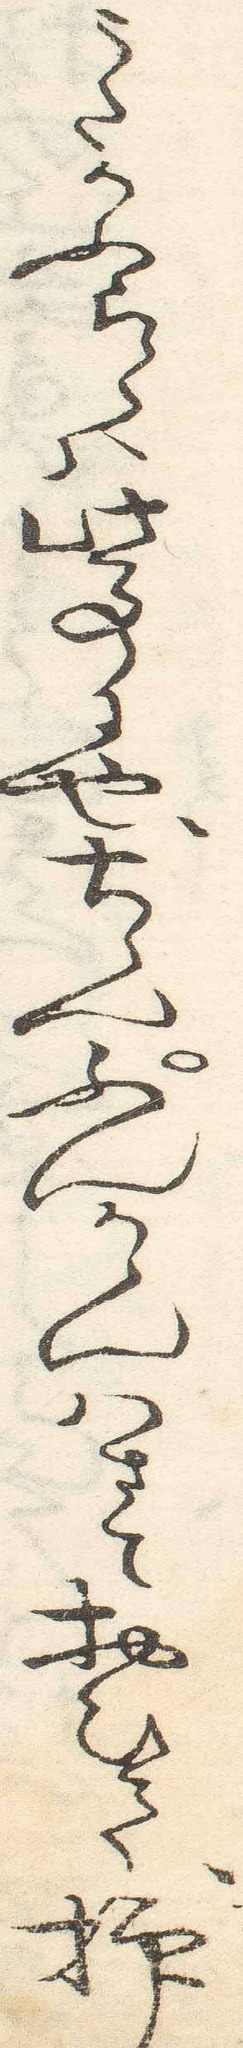うたかうらくは此事にや、ちんぷんかんはさておひて、抑
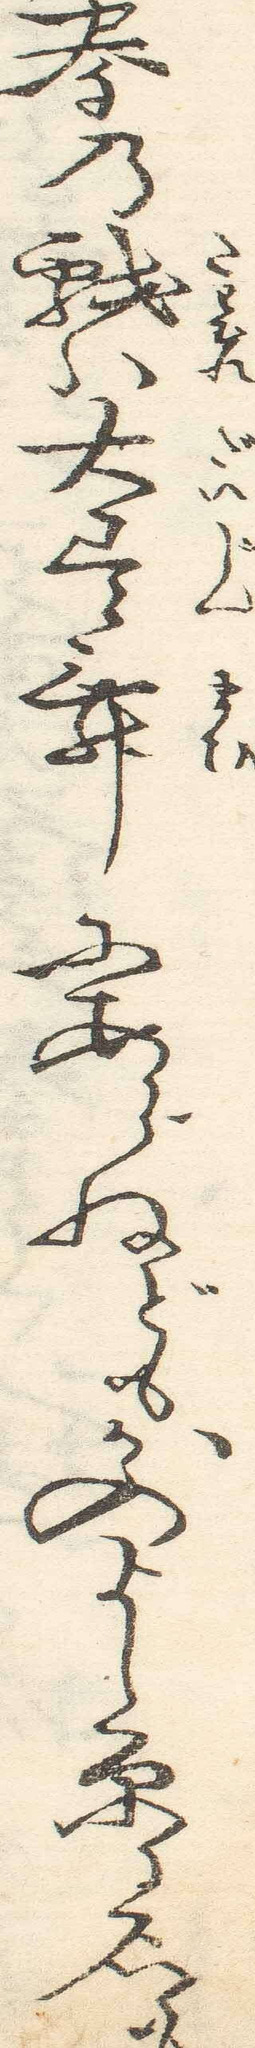拳の戯は大尽舞にあらねども、かのよし原に名も
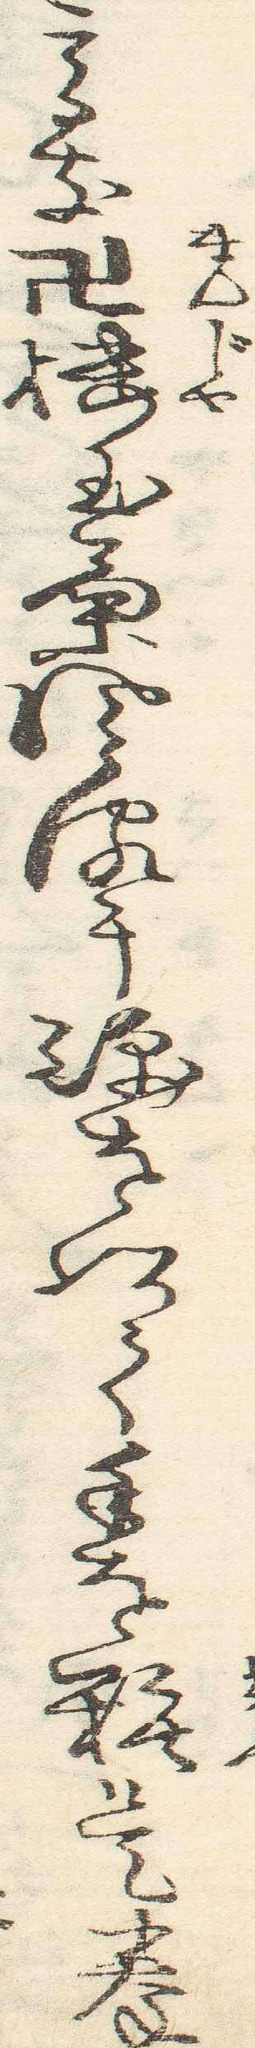高き卍楼玉菊風流に錦を以て手を粧是拳
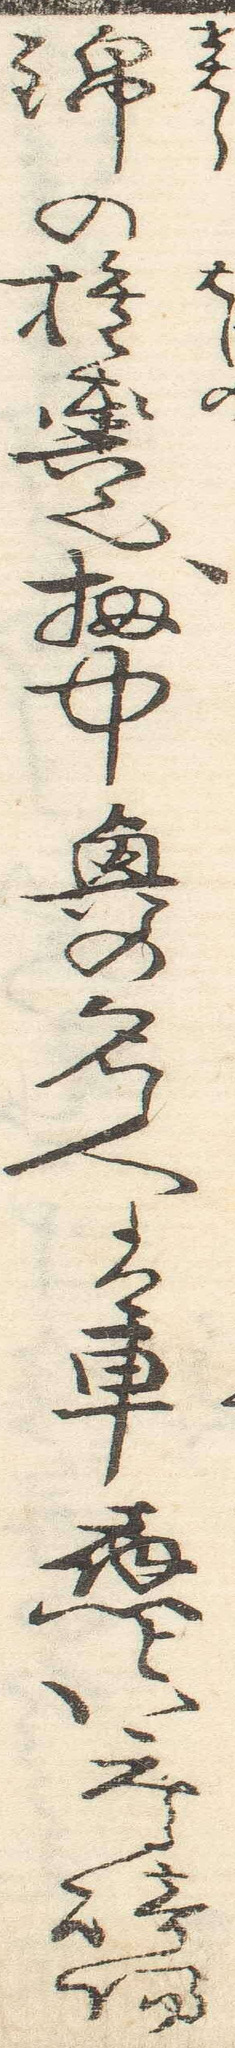錦の権輿也、扨中興の名人は車応といえる崎陽

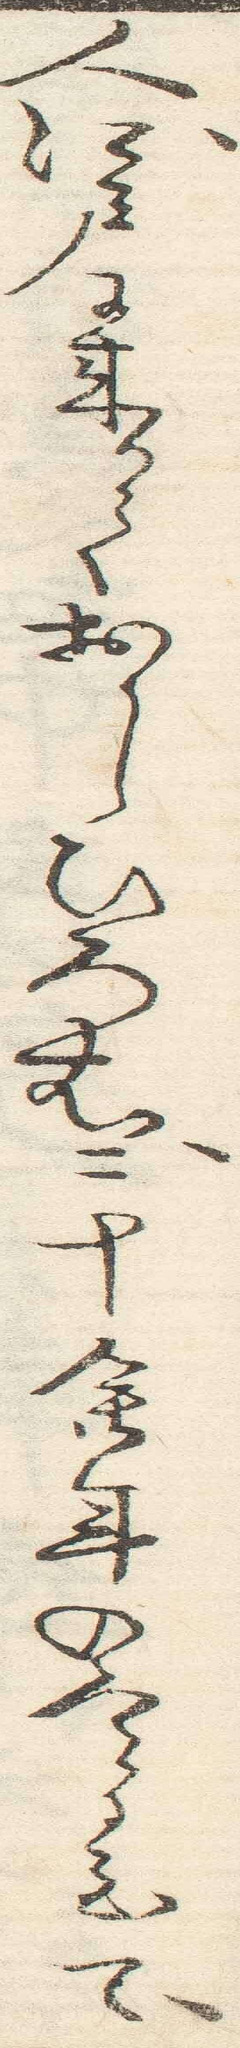人江戸に来りておしひろむ、二十余年の今に至て、
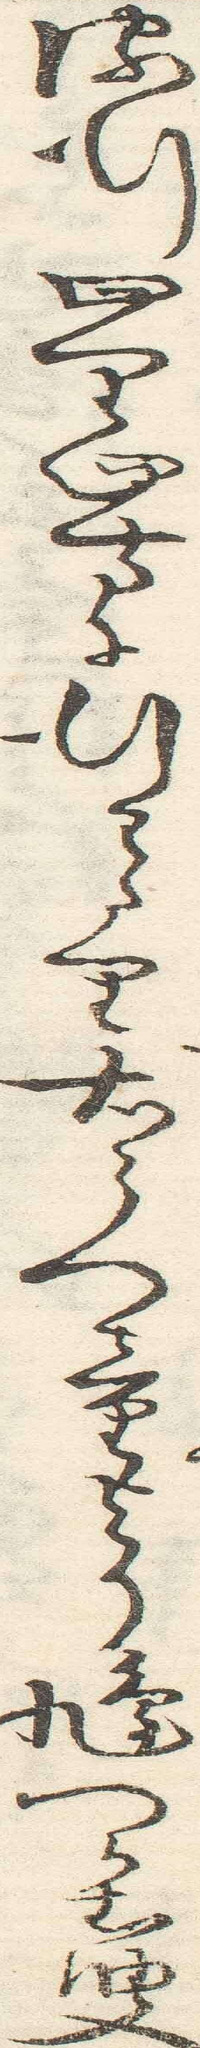流行四里四方に行わたり、うくつ童より鳩つかむ叟
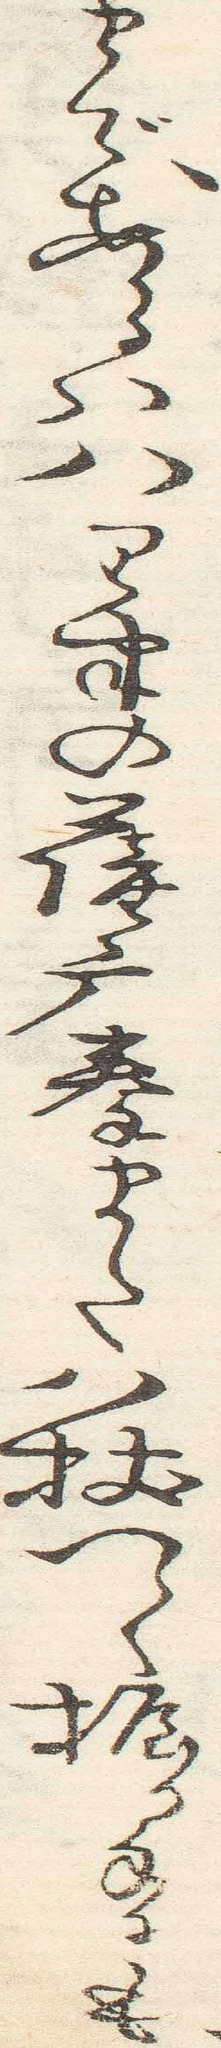まで、あるは八里半の薩摩拳、または杖つく握り手にも、
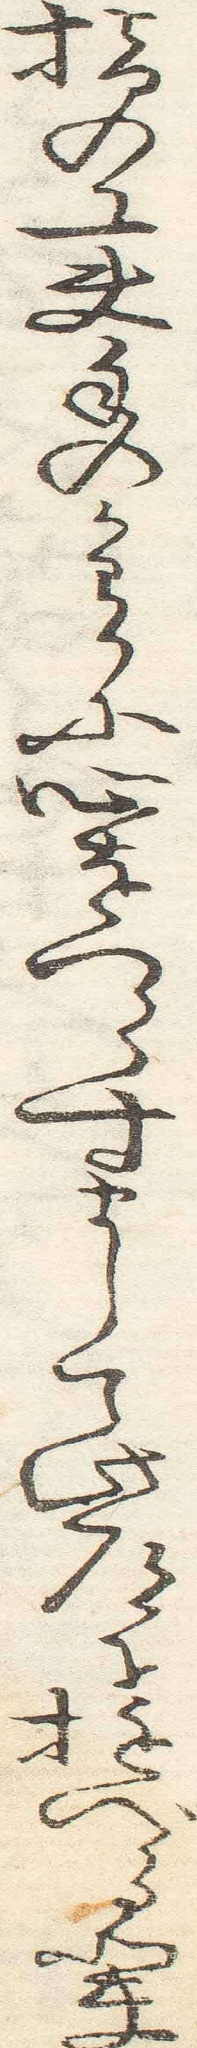指の工夫手のかわりに心をつくす、まして此道に遊べる輩
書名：拳独稽古
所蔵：東京学芸大学附属図書館 国文学研究資料館
